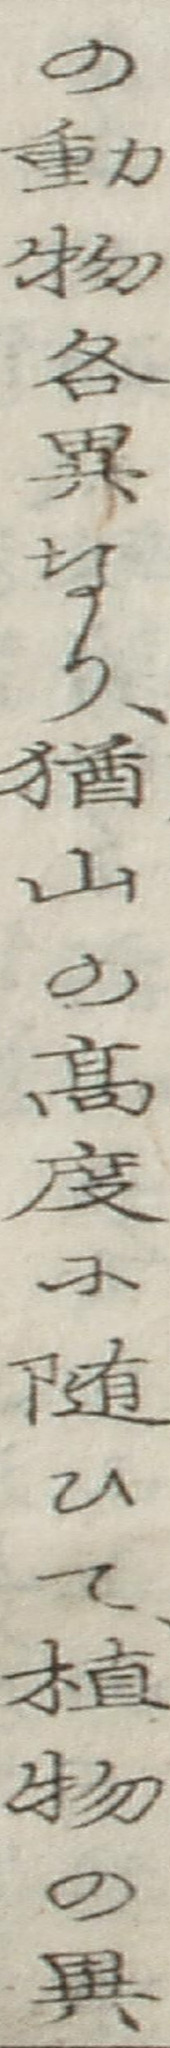の動物各異なり、猶山の高度に随ひて、植物の異

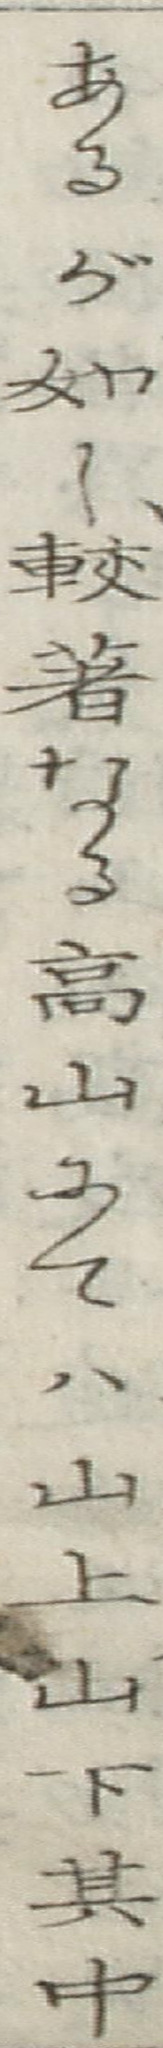あるが如し、較著なる高山にては、山上山下其中
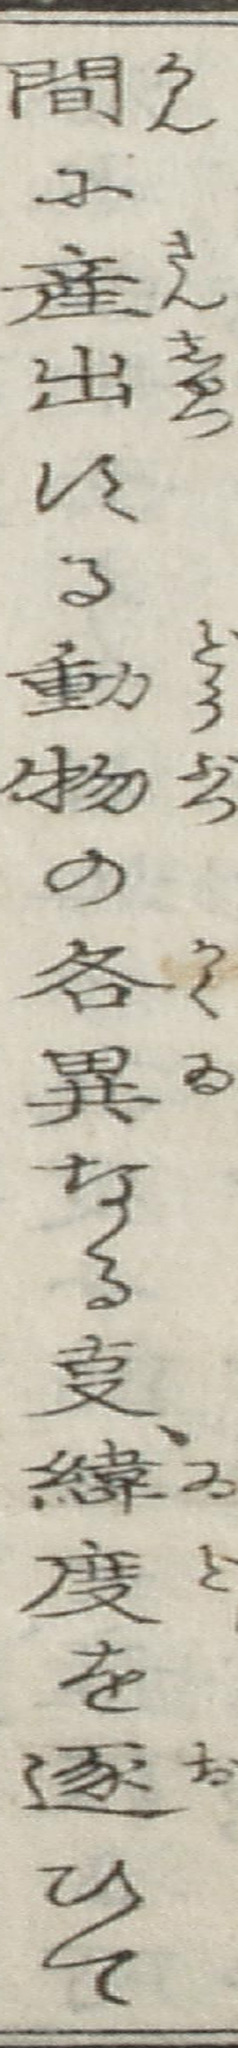間に産出する動物の各異なる事、緯度を逐ひて
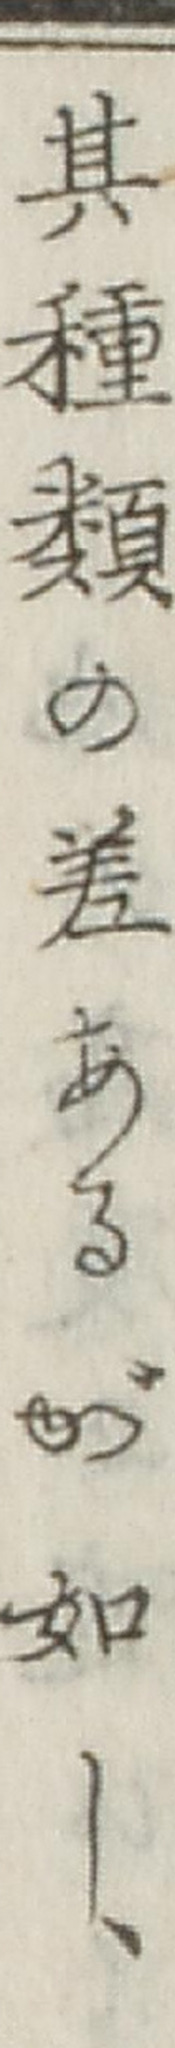其種類の差あるが如し、
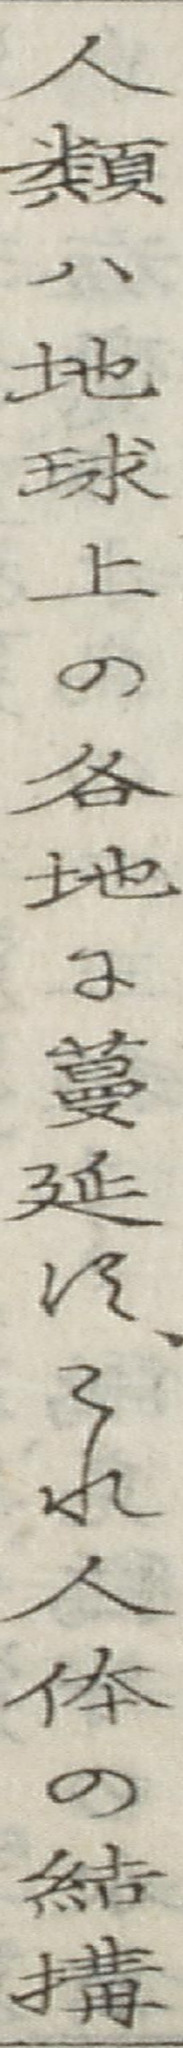人類は地球上の各地に蔓延す、それ人体の結構
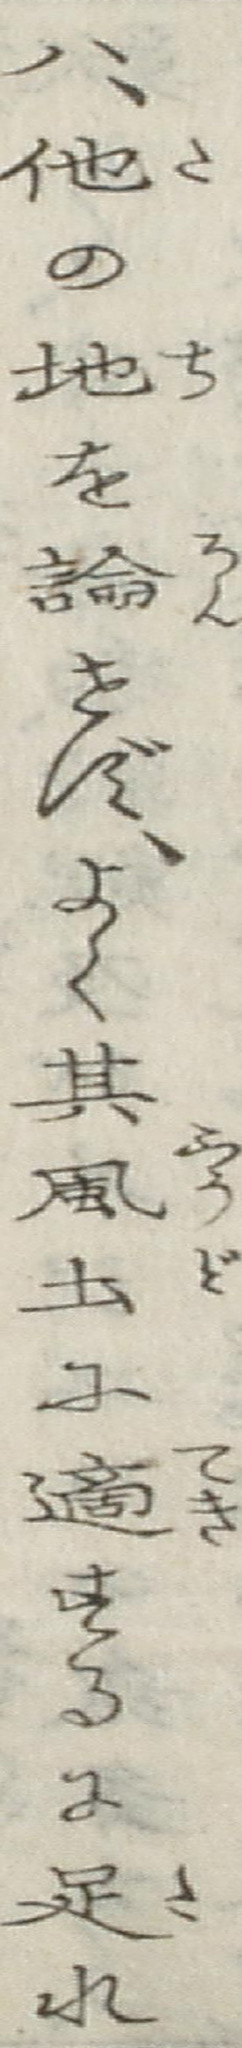は、他の地を論せず、よく其風土に適するに足れ
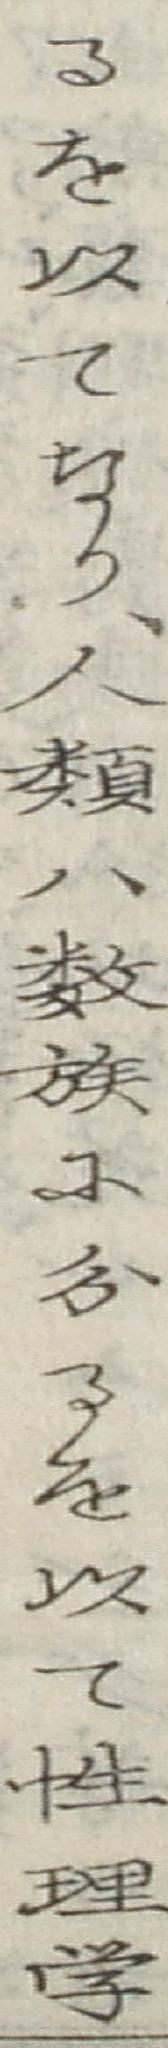るを以てなり、人類は数族に分るを以て、性理学
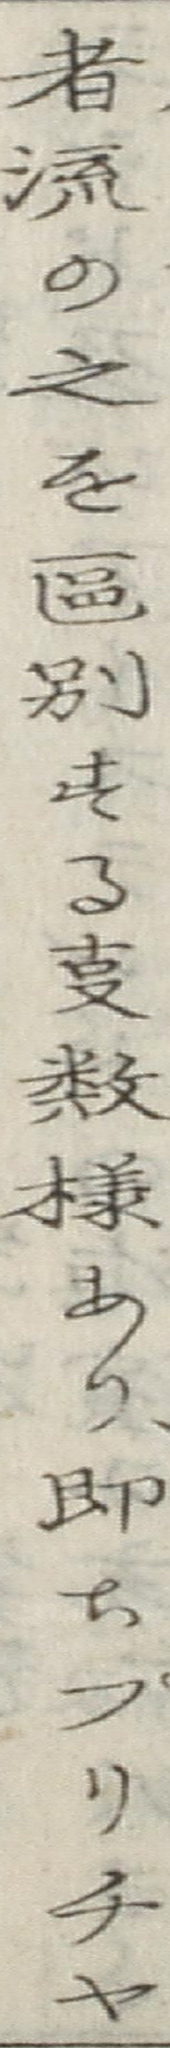者流の之を区別する事数様あり、即ちプリチヤ
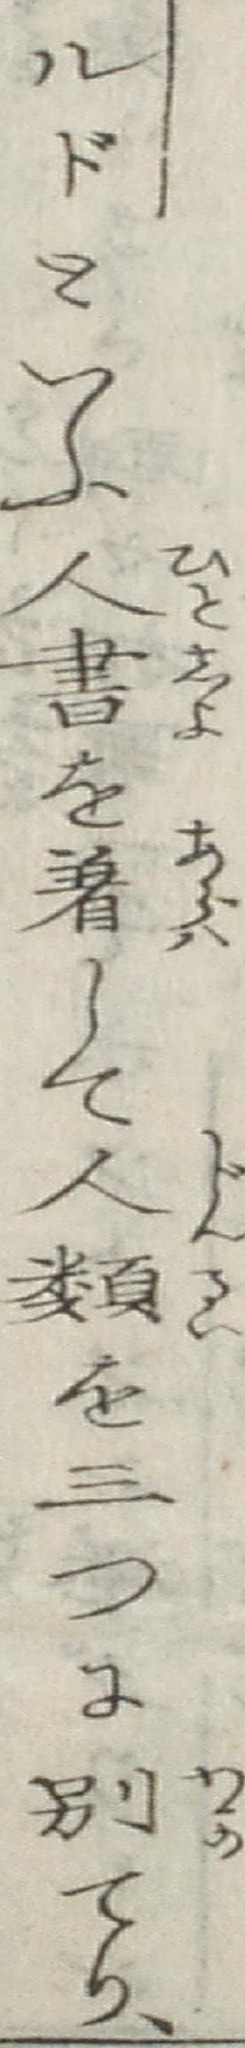ルドといふ人書を著して人類を三つに別てり、
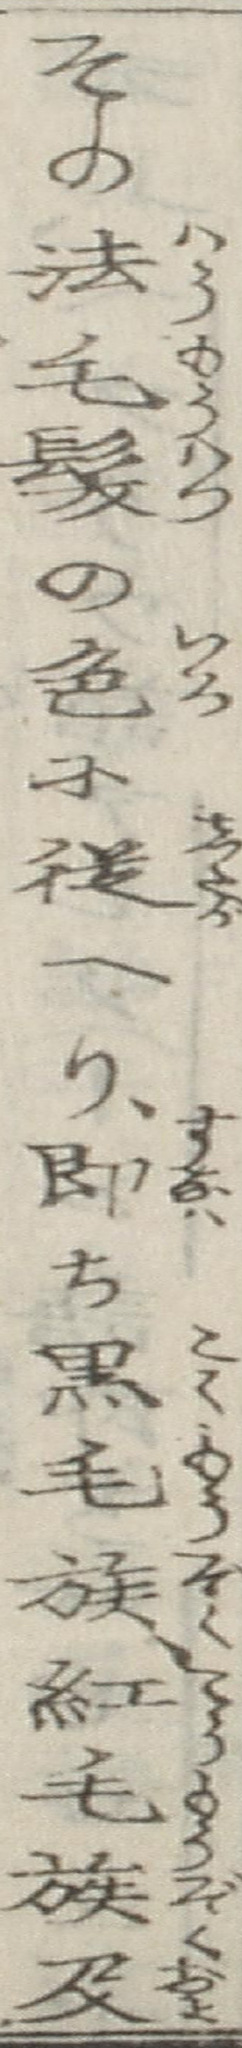その法毛髪の色に従へり、即ち黒毛族、紅毛族及
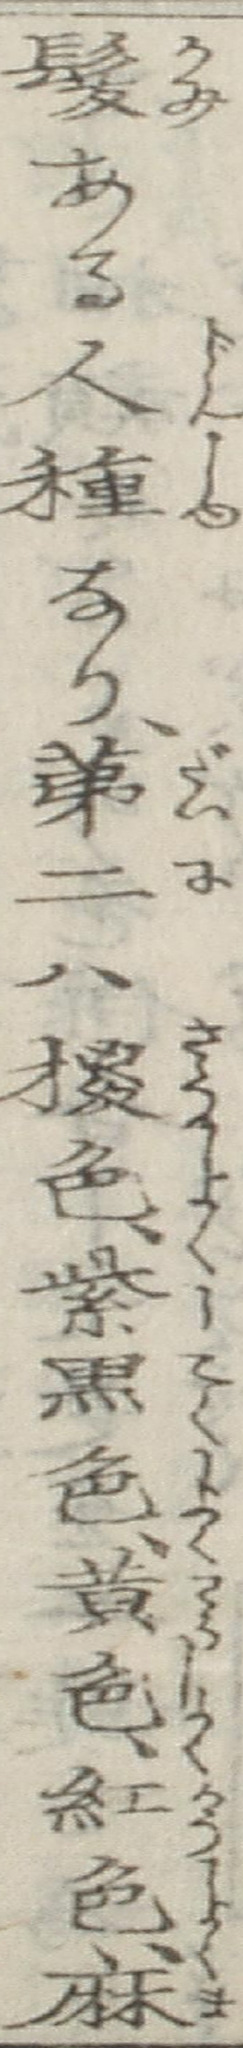び白毛族是なり、第二は椶色、紫黒色、黄色、紅色、麻
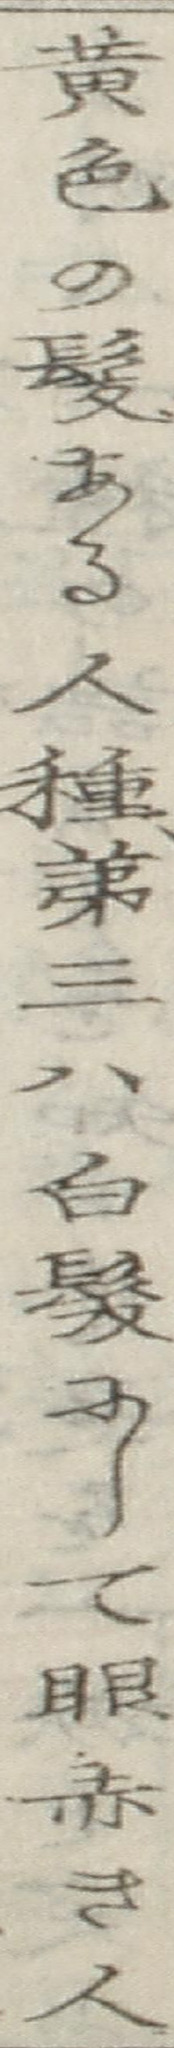黄色の髪ある人種、第三は白髪にして眼赤き人
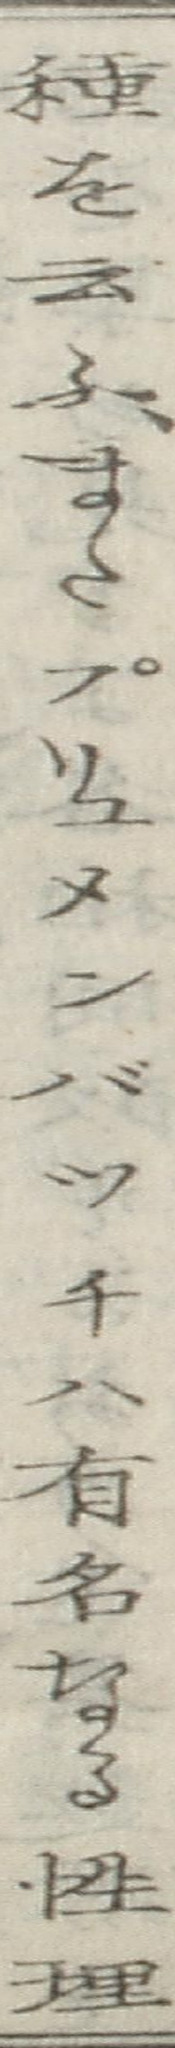種を云ふ、またプリュメンバツチは有名なる性理
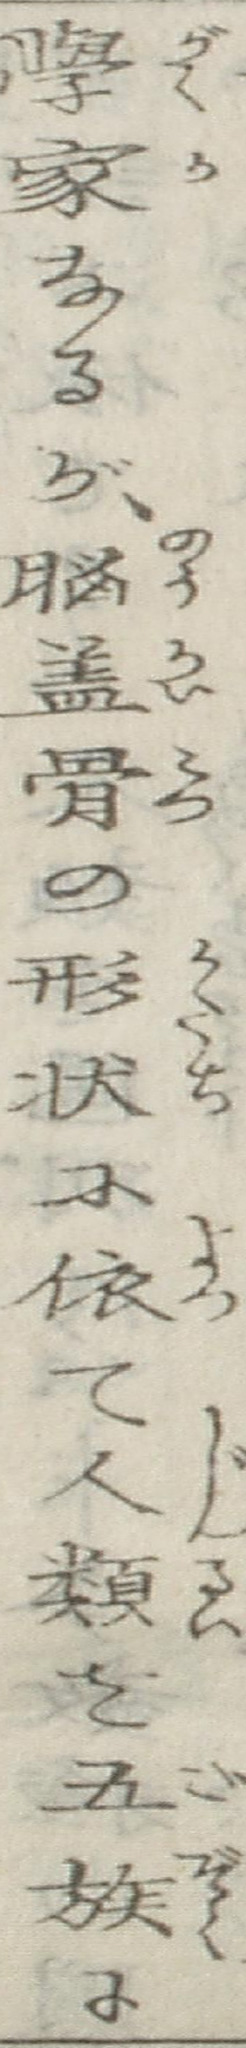学家なるが、脳蓋骨の形状に依て人類を五族に
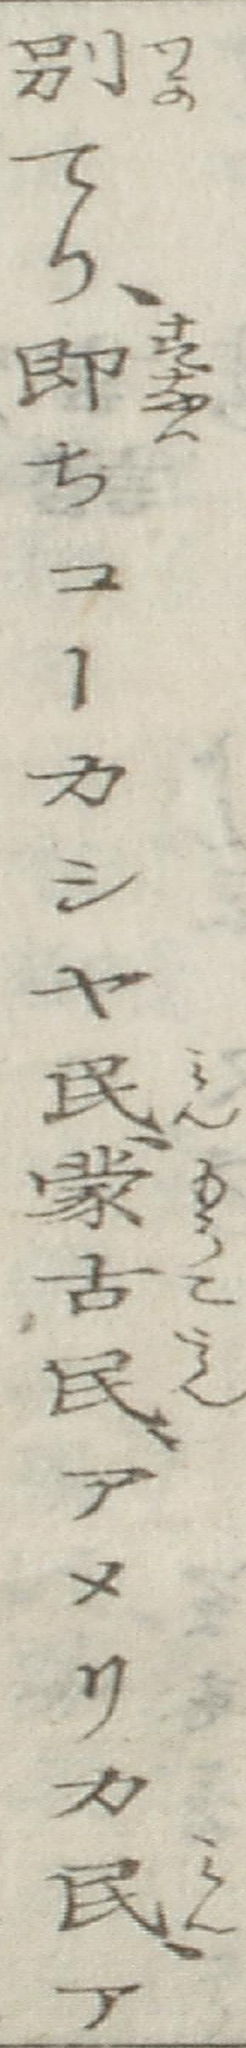別てり、即ちコーカシヤ民、蒙古民、アメリカ民、ア
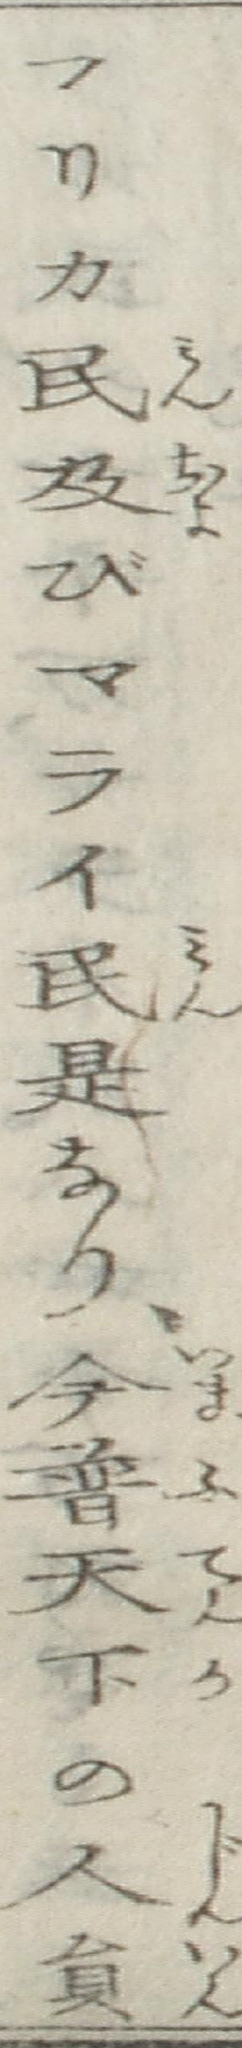フリカ民及びマライ民是なり、今普天下の人員
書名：訓蒙　天然地理學　下
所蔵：東京大学地震研究所図書室 Earthquake Research Institute Library, The University of Tokyo, JAPAN
